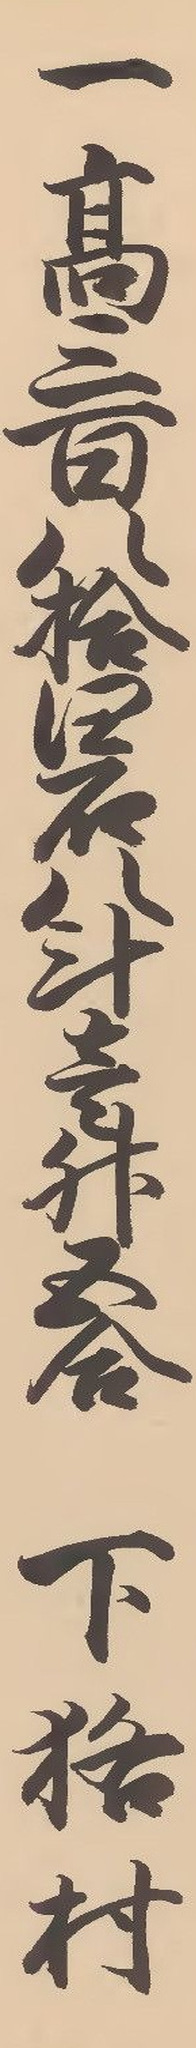一高三百八拾四石八斗壱升五合下狢村
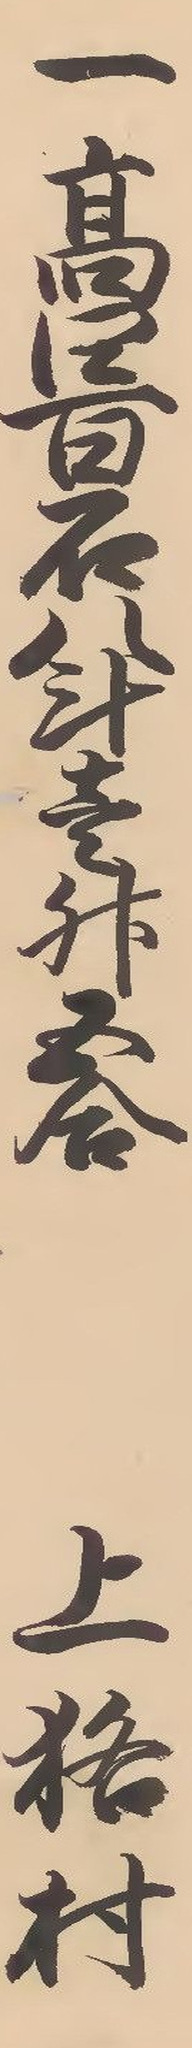一高四百石八斗壱升五合上狢村

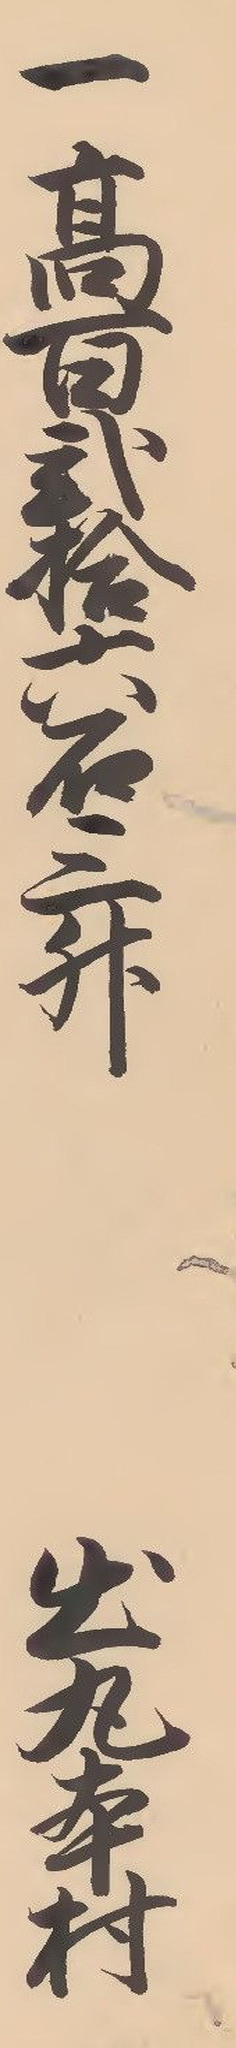一高百弐拾六石三升出丸本村
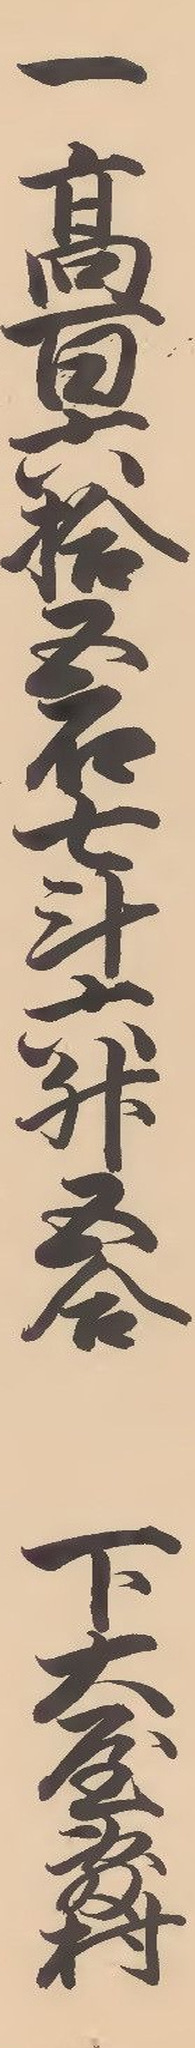一高百六拾五石七斗六升五合下大屋敷村
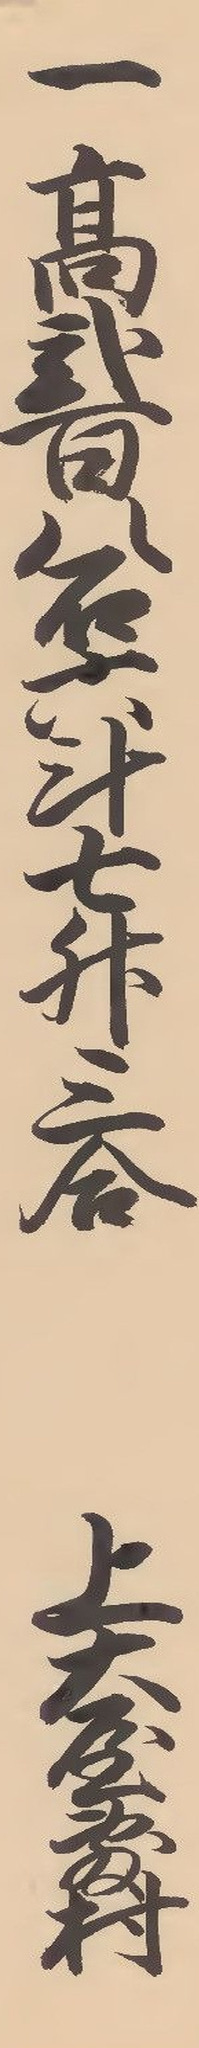一高弐百八石六斗七升三合上大屋敷村
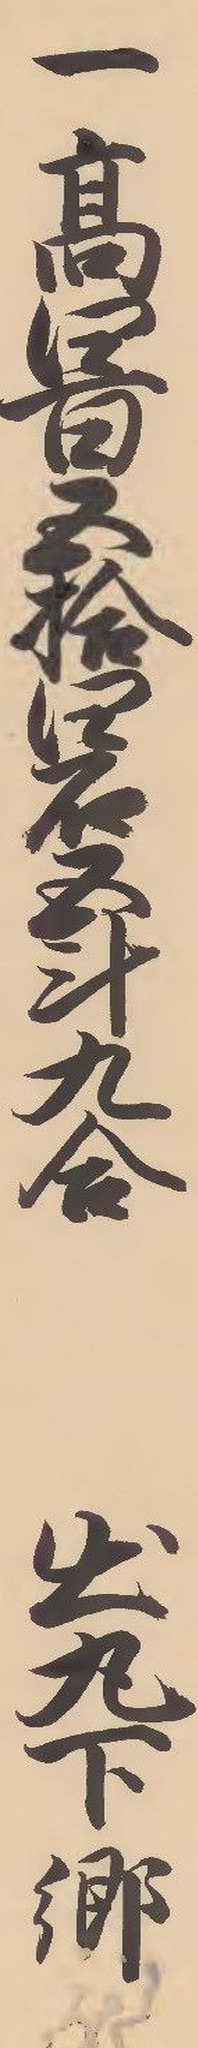一高四百五拾四石五斗九合出丸下郷
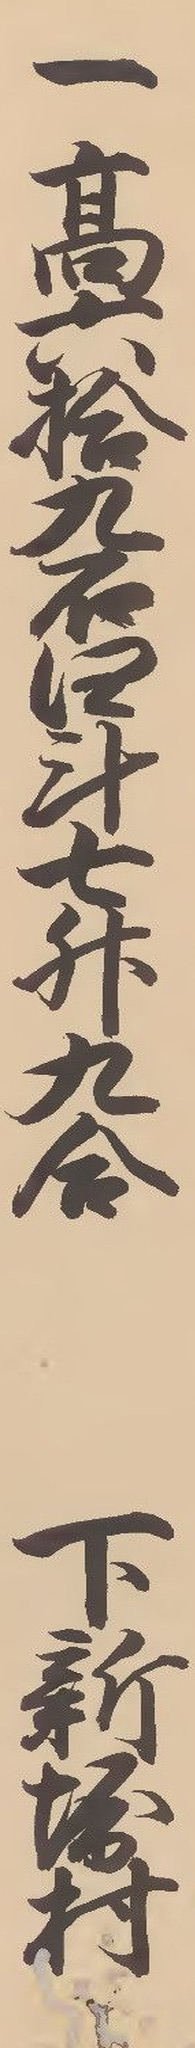一高六拾九石四斗七升九合下新堀村
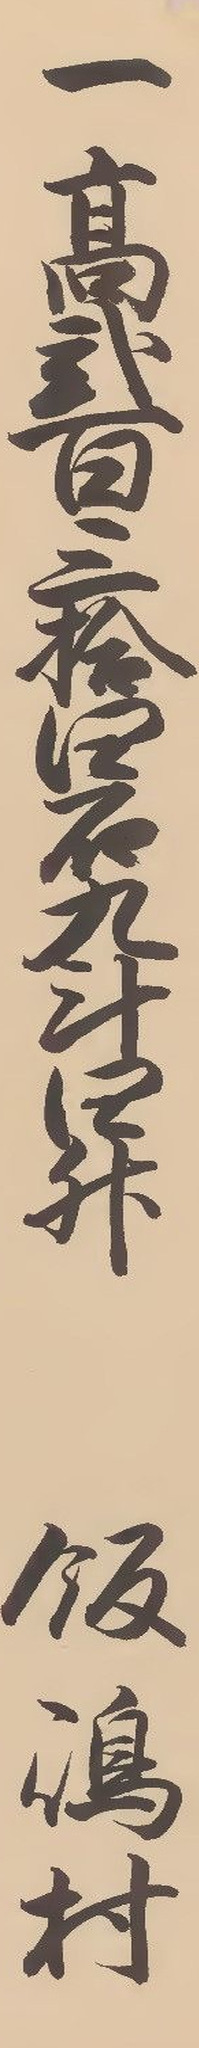一高弐百三拾四石九斗四升飯嶋村
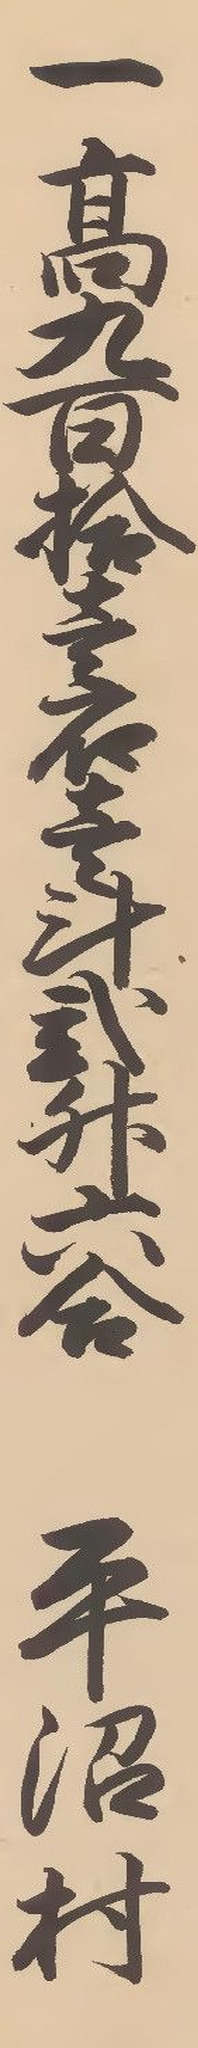一高九百拾壱石壱斗弐升六合平沼村
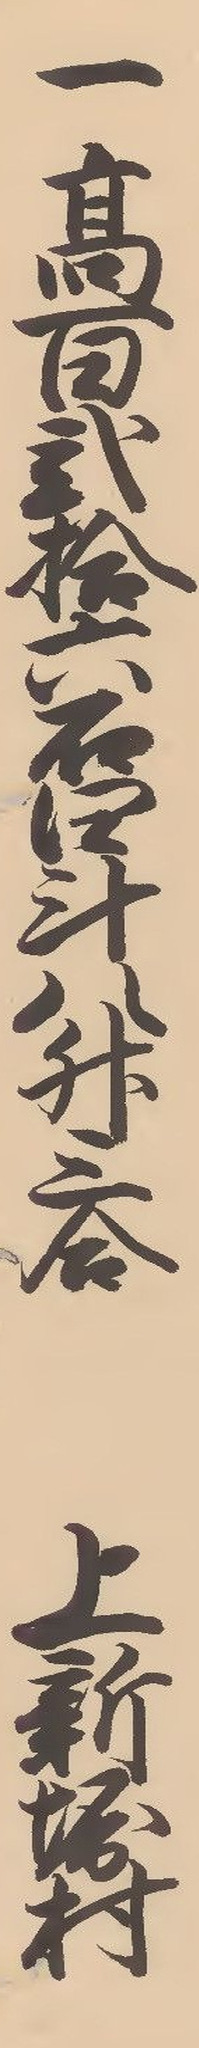一高百弐拾六石四斗八升三合上新堀村

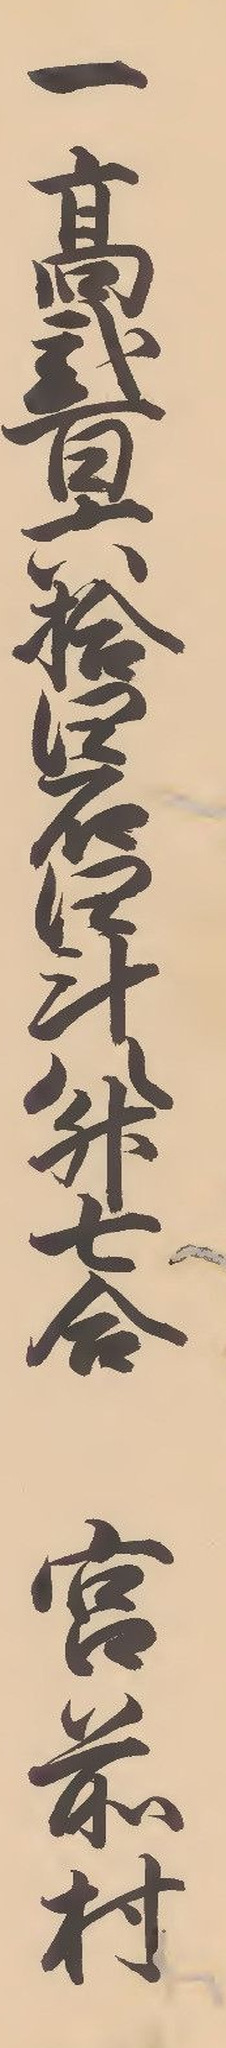一高弐百六拾四石四斗八升七合宮前村
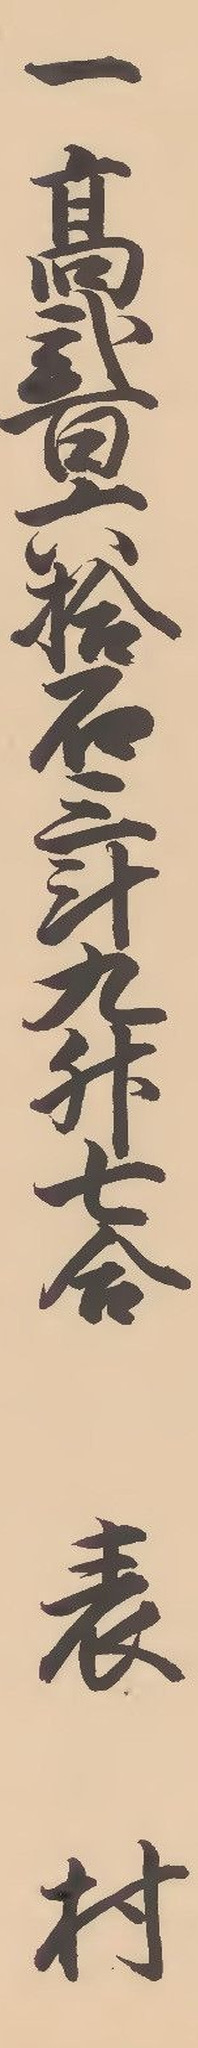一高弐百六拾石三斗九升七合表村
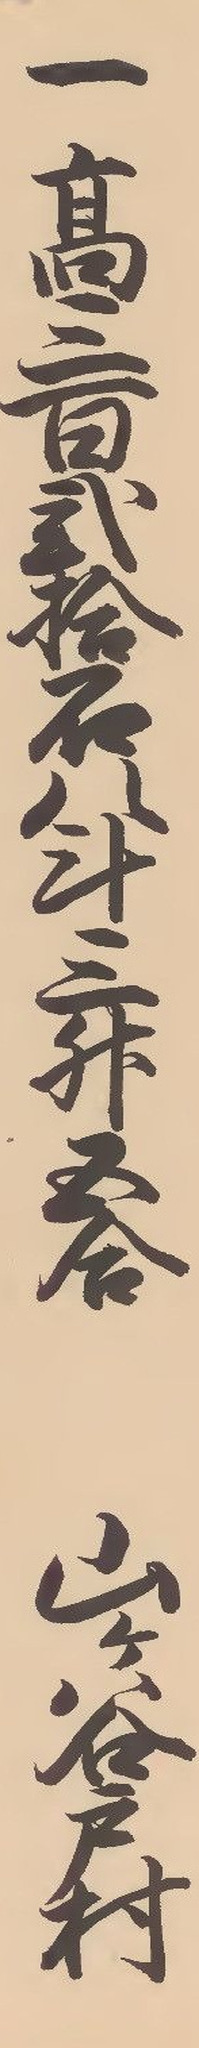一高三百弐拾石八斗三升五合山ヶ谷戸村
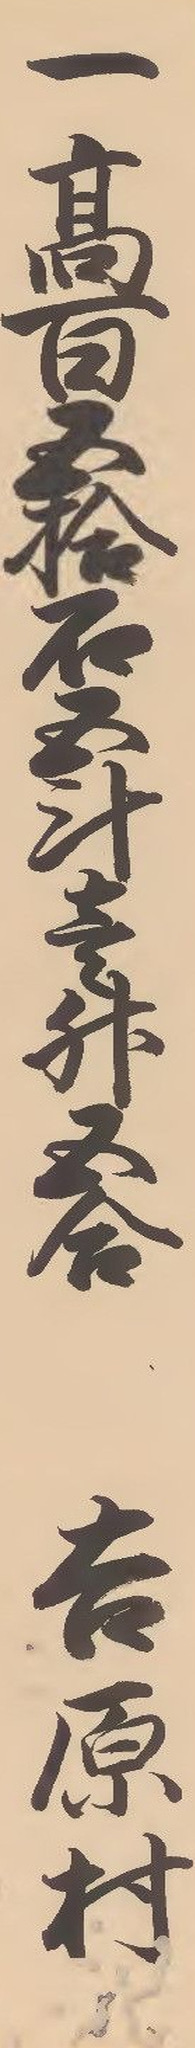一高百五拾石五斗壱升五合吉原村
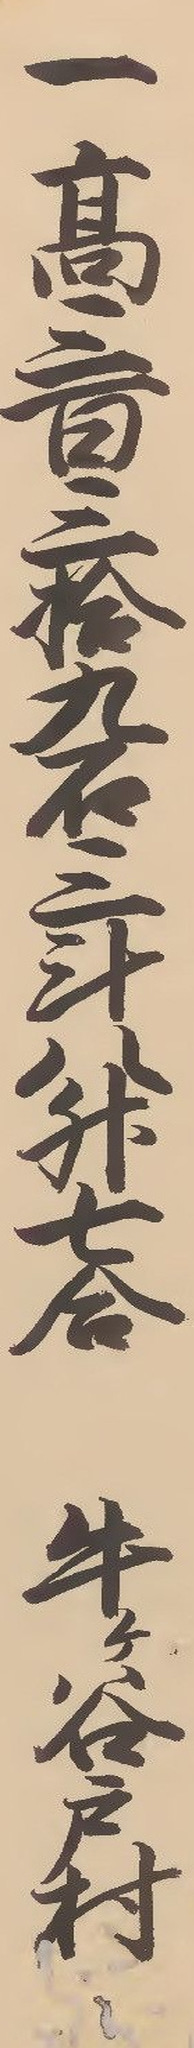一高三百三拾九石三斗八升七合牛ヶ谷戸村
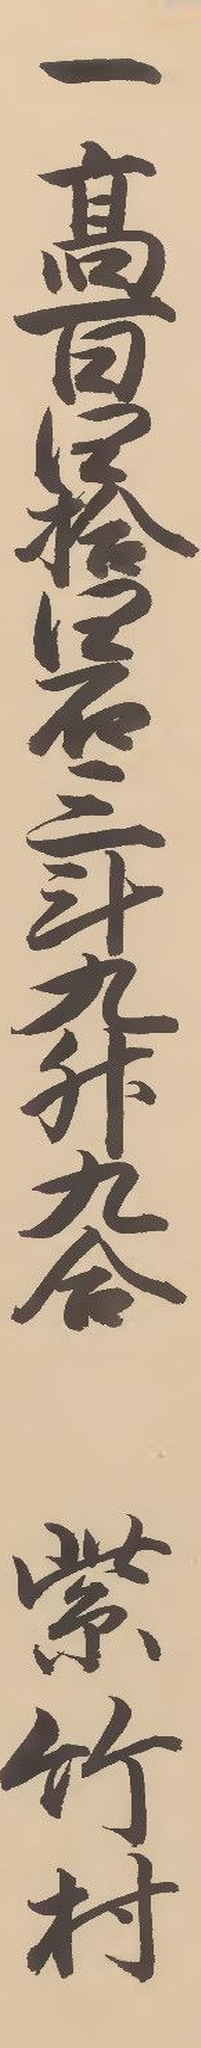一高百四拾四石三斗九升九合紫竹村
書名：武蔵国郷帳　下
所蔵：国立公文書館 National Archives of Japan
